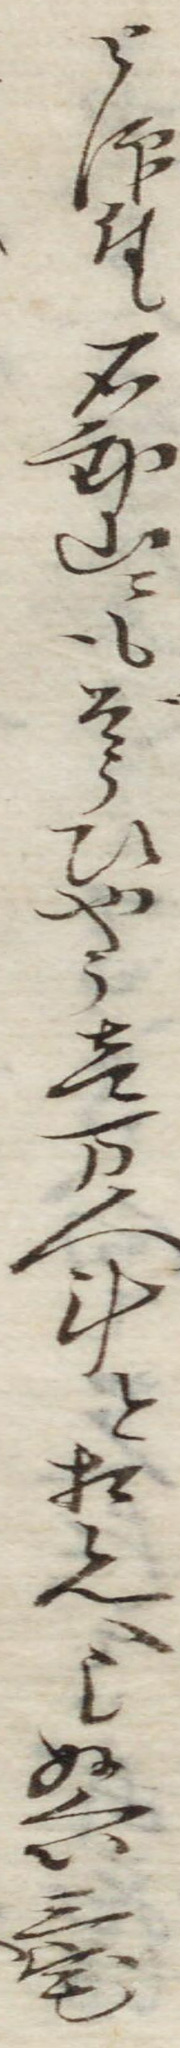被仰付候石動山にもぞうひやう壱万人斗と相見へ申候ぬくい三宅
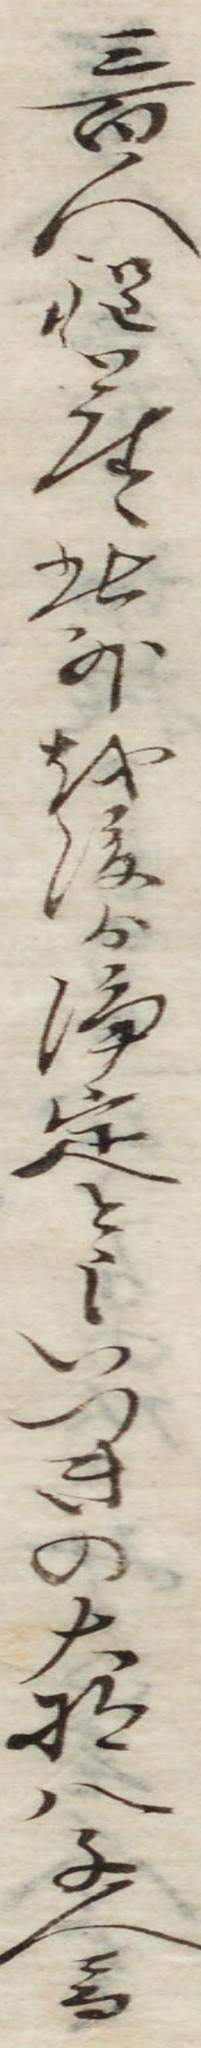三百人程御座候此外越後ゟ浄定と申いつきの大将八千人に而
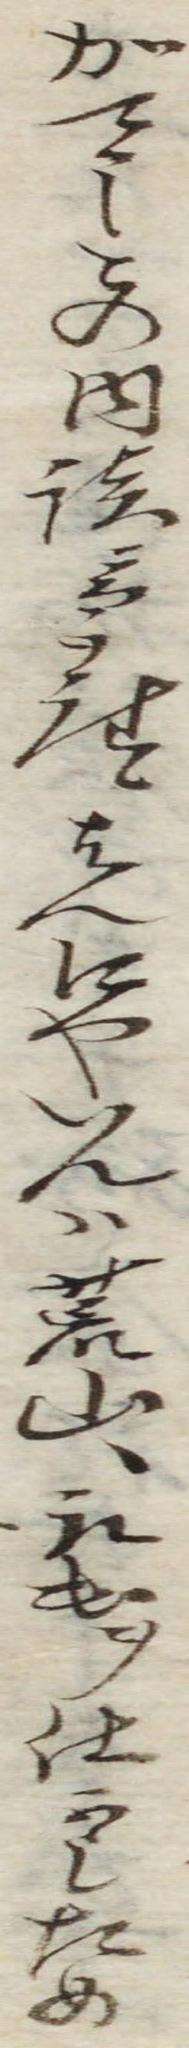加可申との内談に而御座候はんにやいんは荒山へ取出を仕可申ため
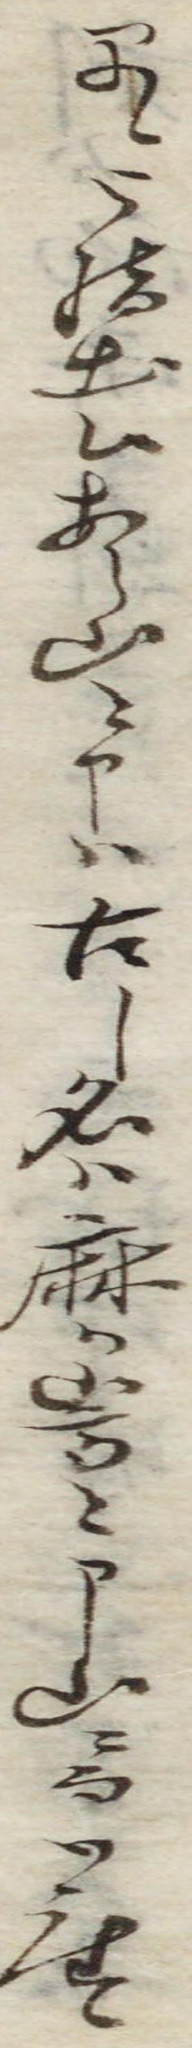早々被指出候あら山と申は古し名は麻か嵩と申山に而御座候
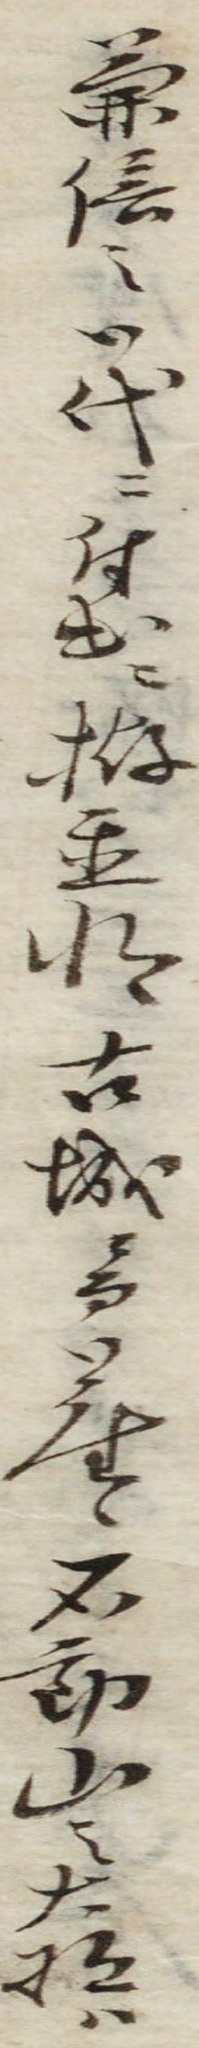兼信之御代に付出に拵置古城に而御座候石動山之大将は
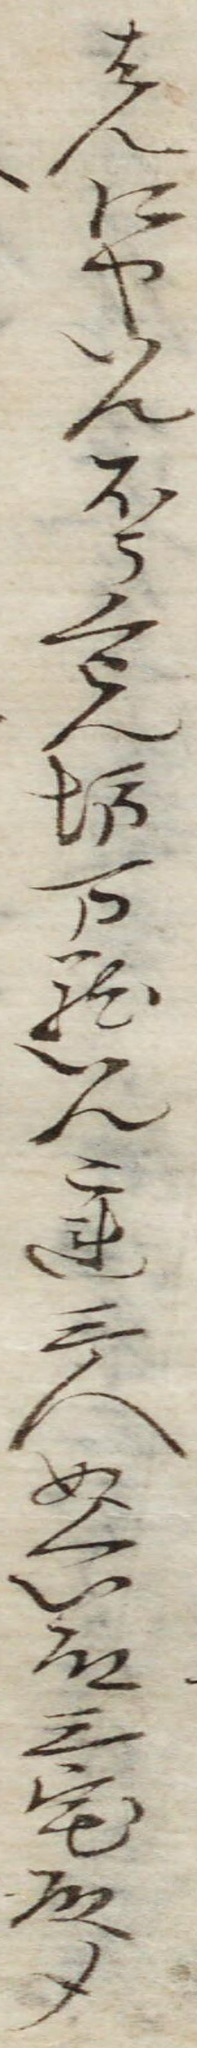はんにやいんほうくらん坊万蔵いんこれ三人ぬくい殿三宅殿〆
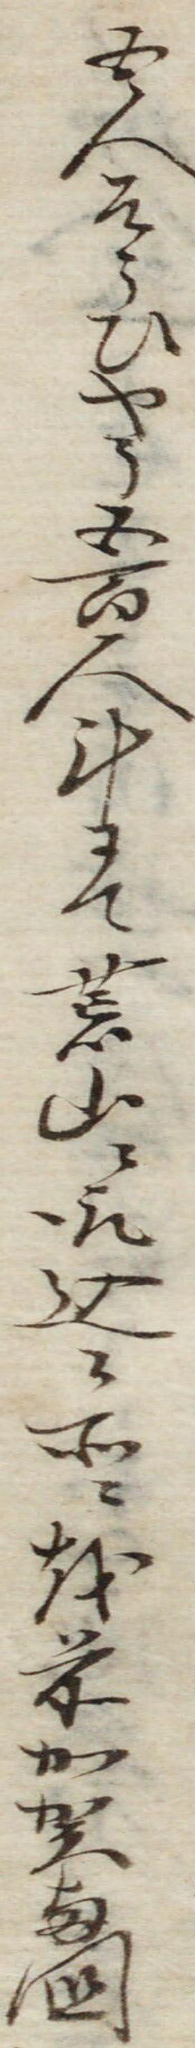五人そうひやう五百人斗にて荒山に取込所に越前加賀両国

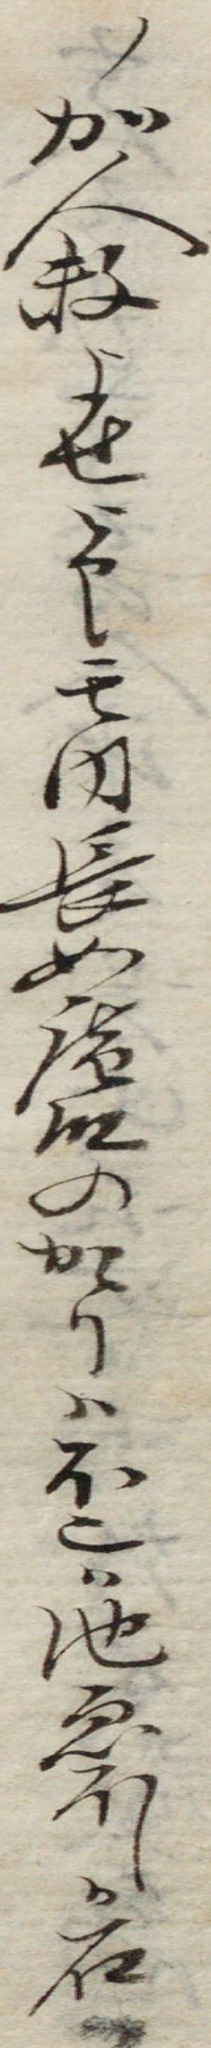ノ加人数よせ被申候其内長如庵殿のかゝりはほこか池ゑほしか石
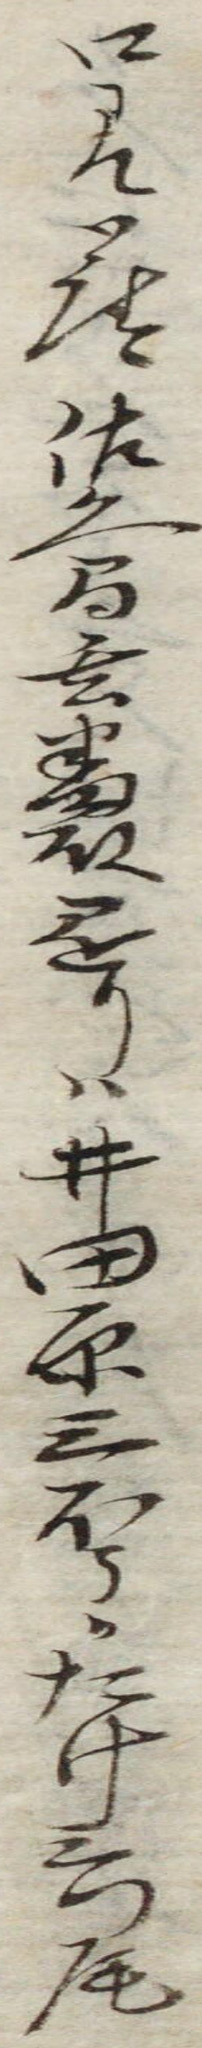口にて御座候佐久間玄蕃殿懸りは井田原三ほうかたけ三つ尾
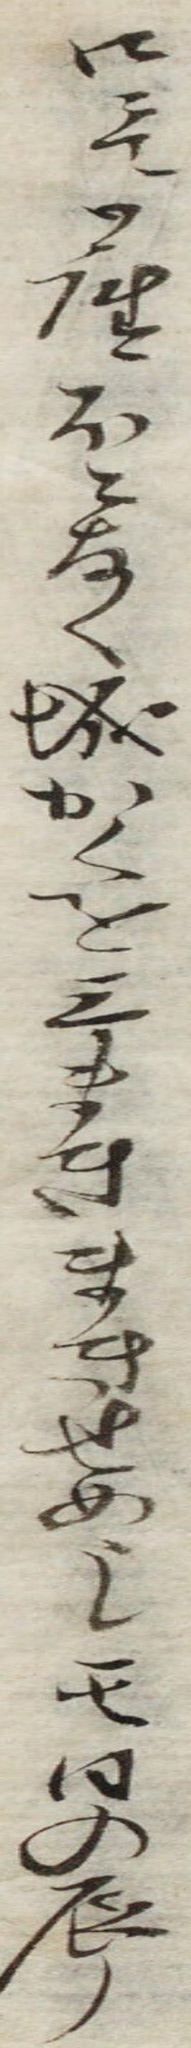口にて御座候ほとなく城かくを三まきまきせめ申候其日の辰ノ
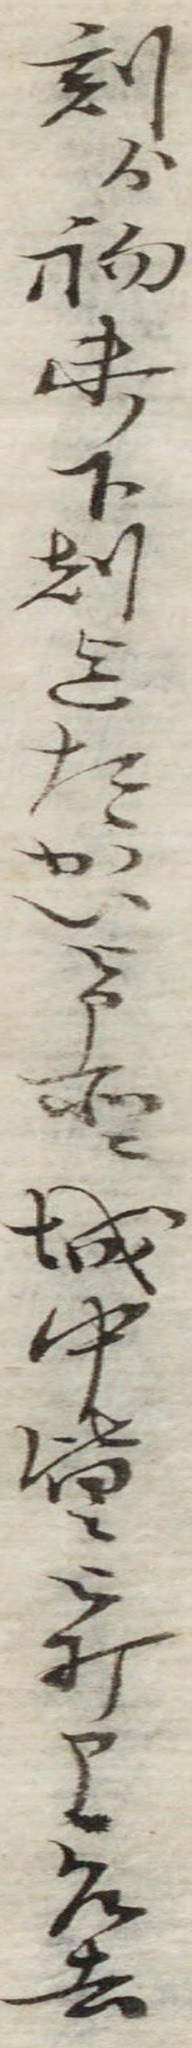刻ゟ初未ノ下刻迄たゝかい被申所に城中皆々被打申候乍去
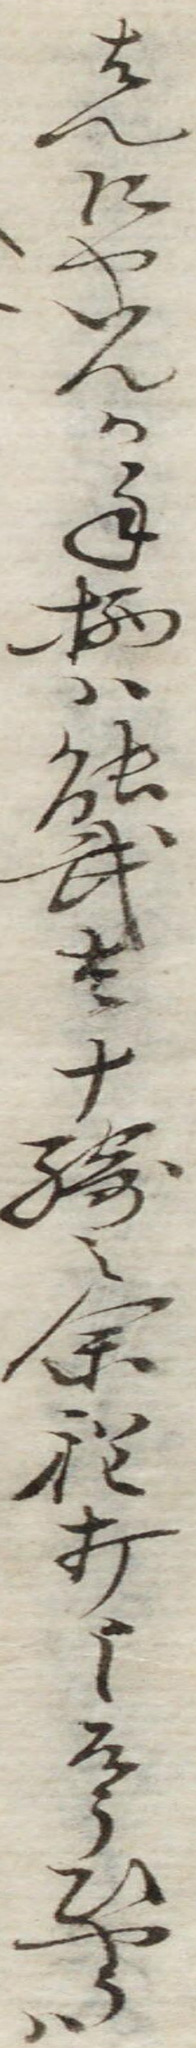はんにやいんか手柄は能武者十騎之余程打申そうひやうは
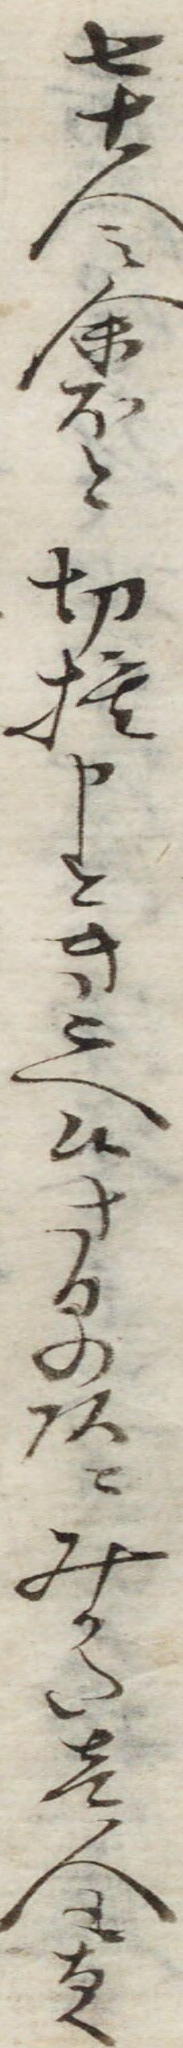七十人之余ほと切捨申ときこへ候さるの頭にみかた壱人もなく
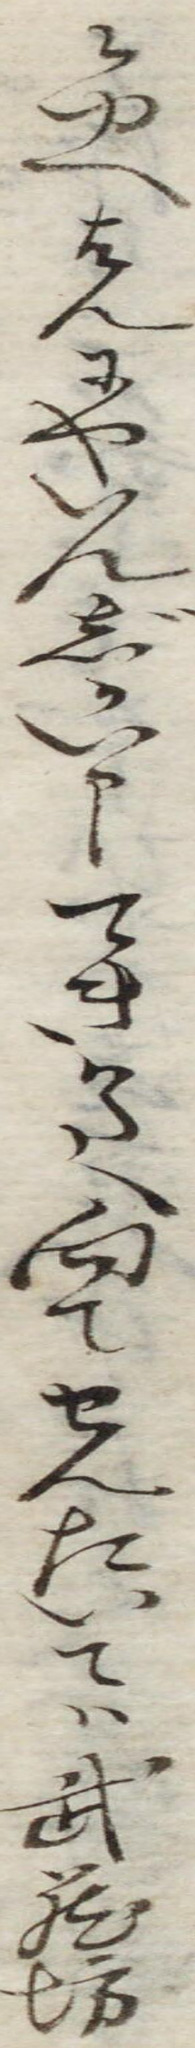候ゆへはんにやいんじかい申てきかたへ向てせんたいては武蔵坊
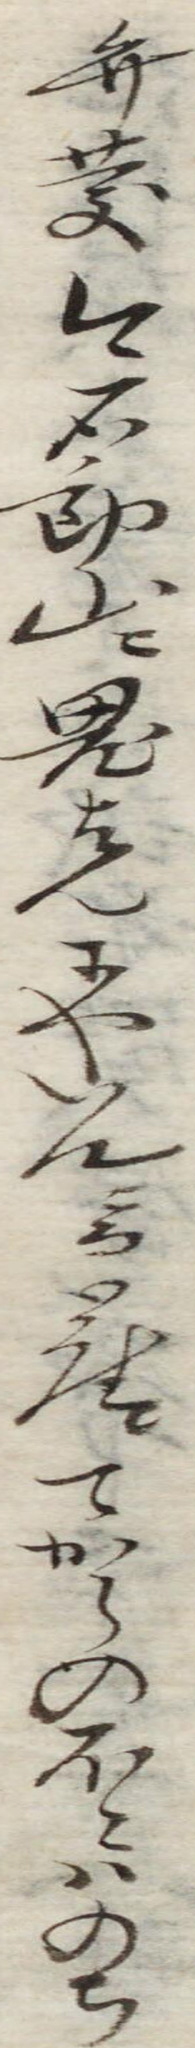弁慶今石動山に畏はんにやいんに而御座候てからのほとはのち
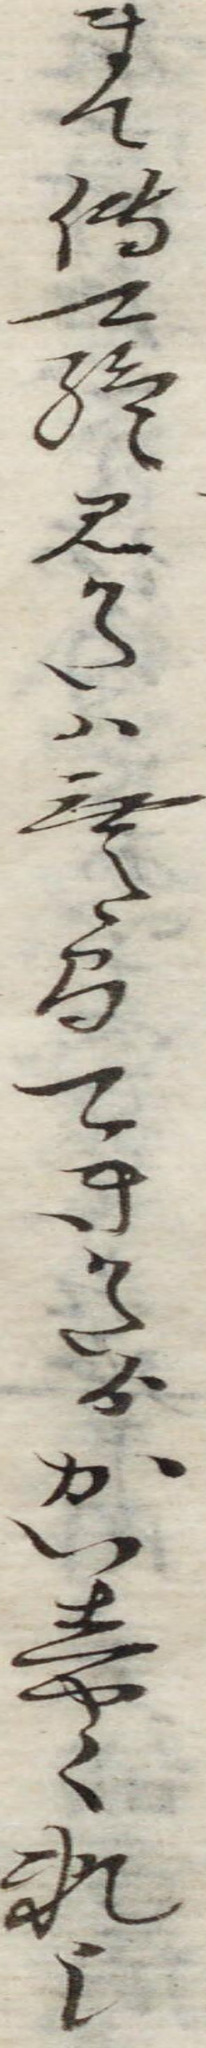まて伝可給候みかたは無之間てきかたゟかいしやく執申候
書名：古老紀談等
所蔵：Ishikawa Prefectural Library
